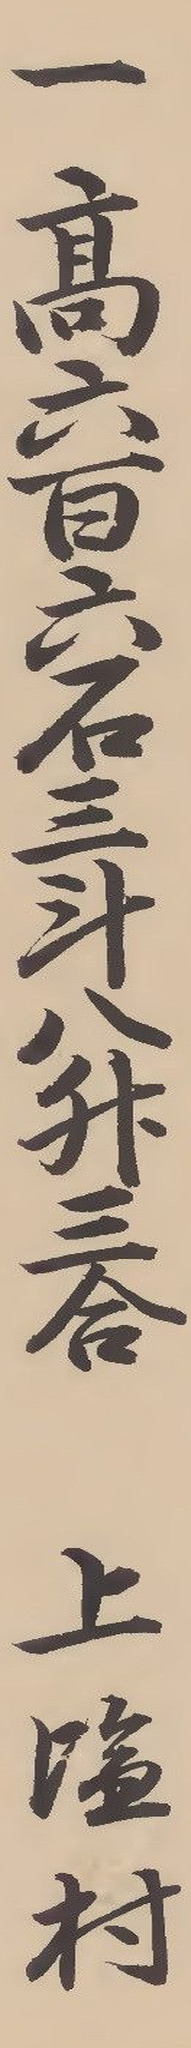一高六百六石三斗八升三合上塩村
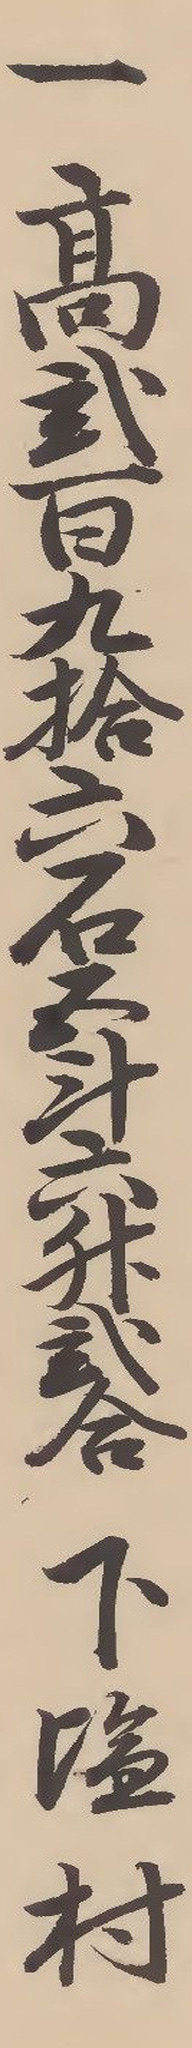一高弐百九拾六石五斗六升弐合下塩村
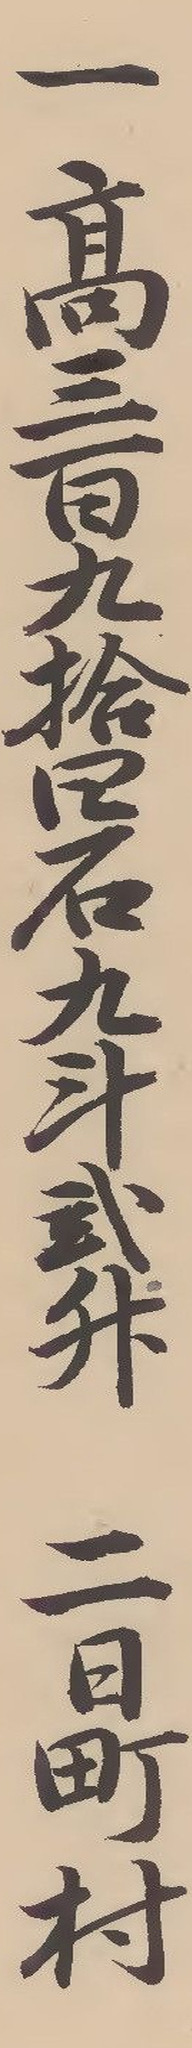一高三百九拾四石九斗弐升二日町村

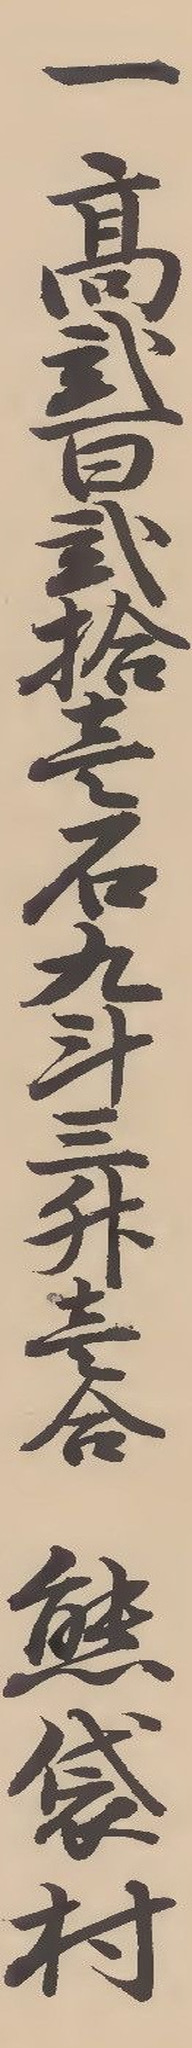一高弐百弐拾壱石九斗三升壱合熊袋村
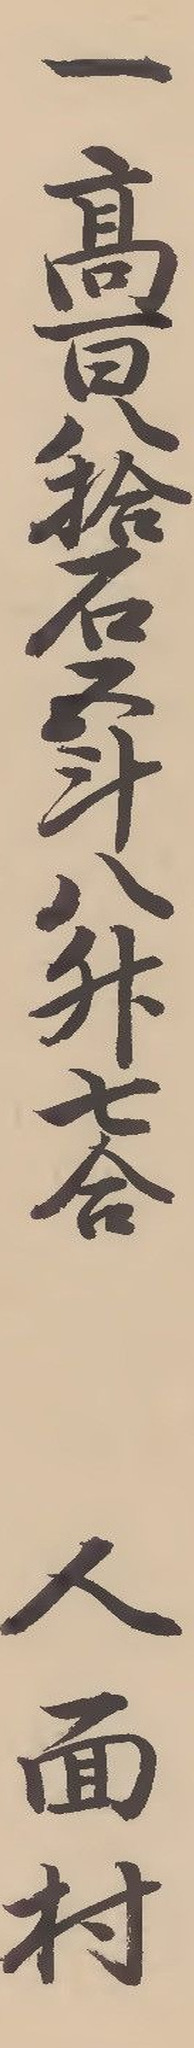一高百八拾石五斗八升七合人面村
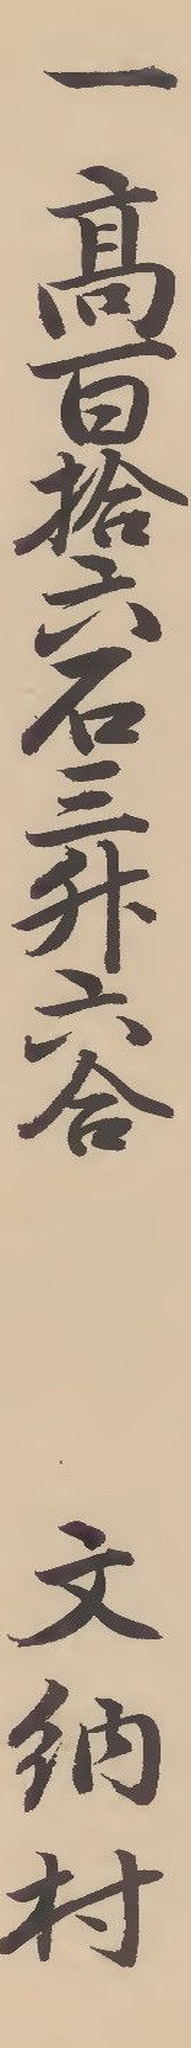一高百拾六石三升六合文納村
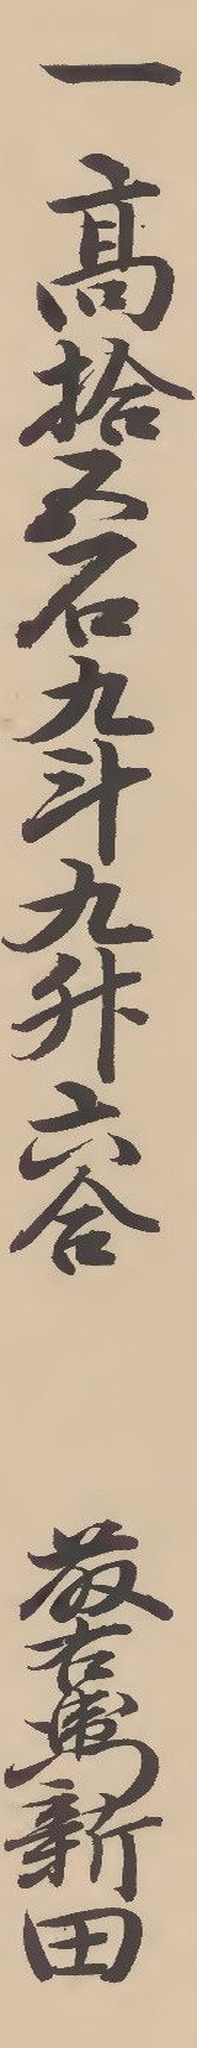一高拾五石九斗九升六合藤右衛門新田
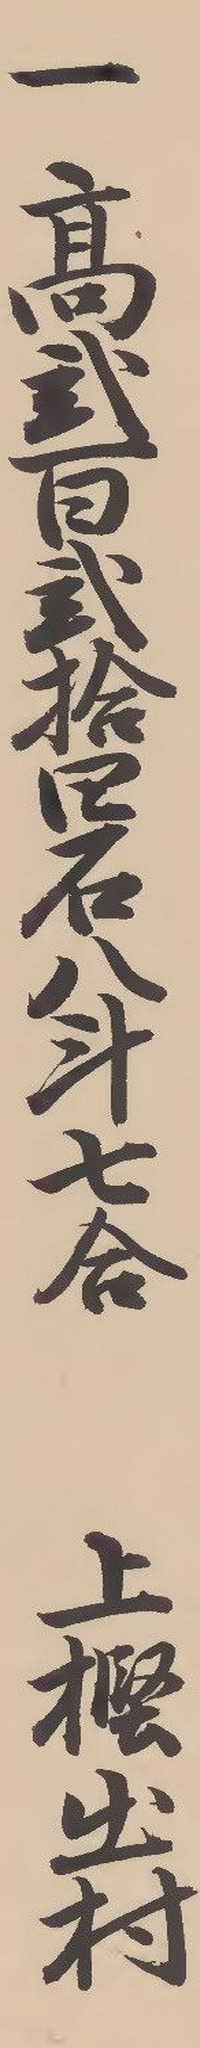一高弐百弐拾四石八斗七合上樫出村
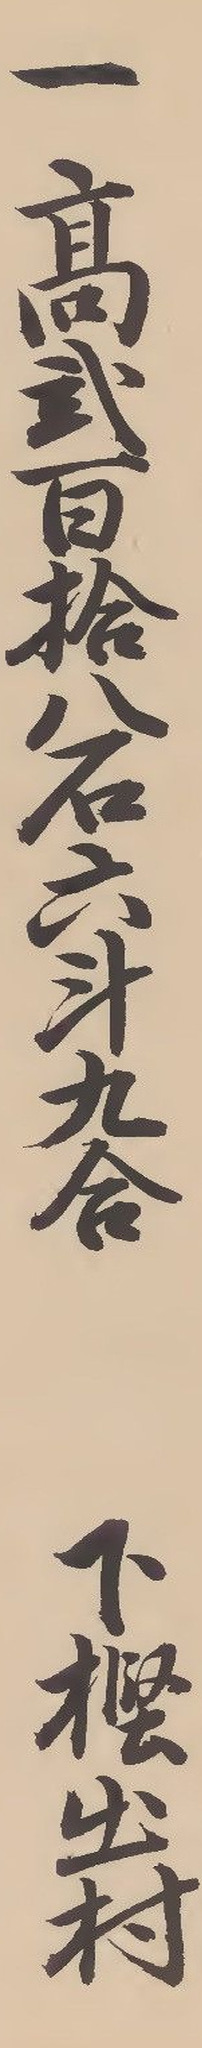一高弐百拾八石六斗九合下樫出村
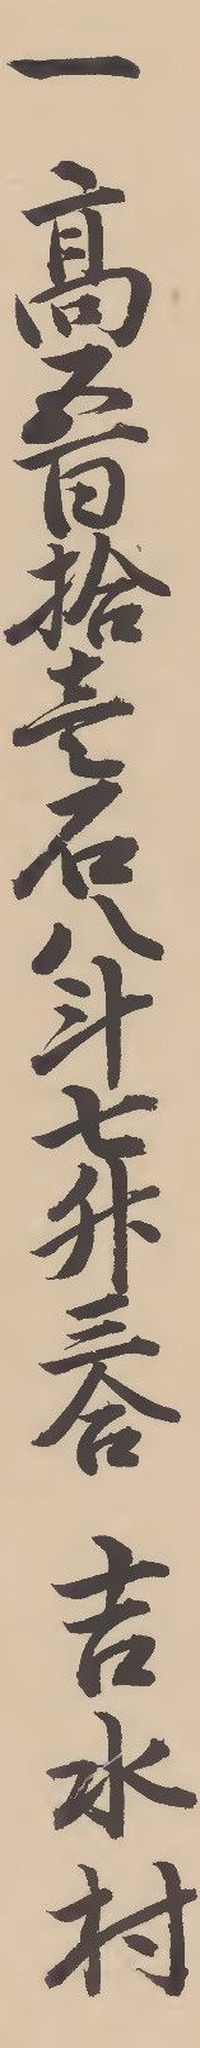一高五百拾壱石八斗七升三合吉水村
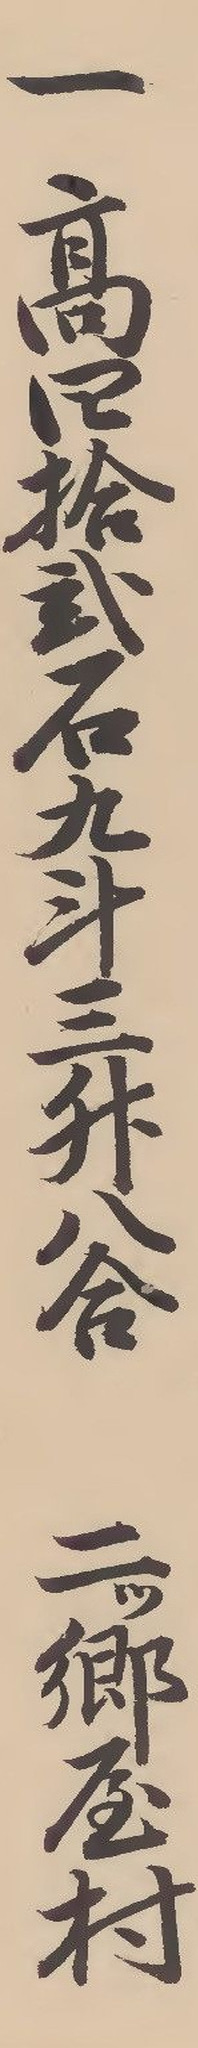一高四拾弐石九斗三升八合二ッ郷屋村

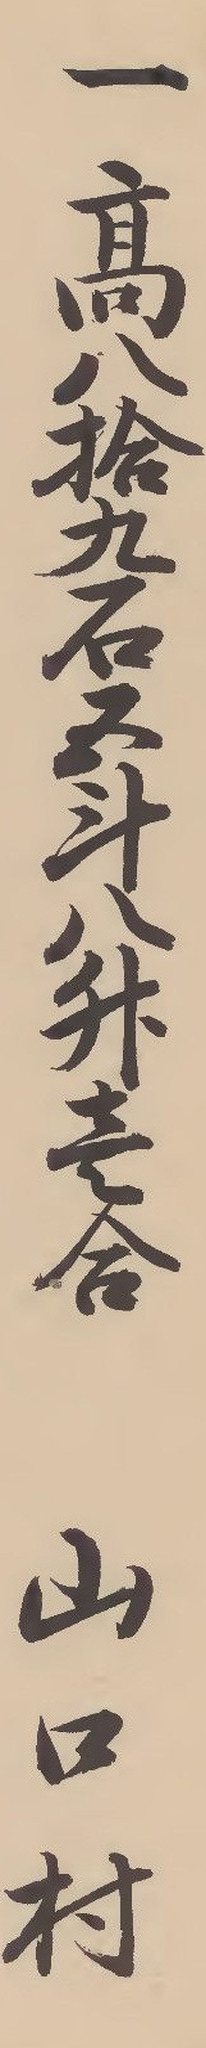一高八拾九石五斗八升壱合山口村
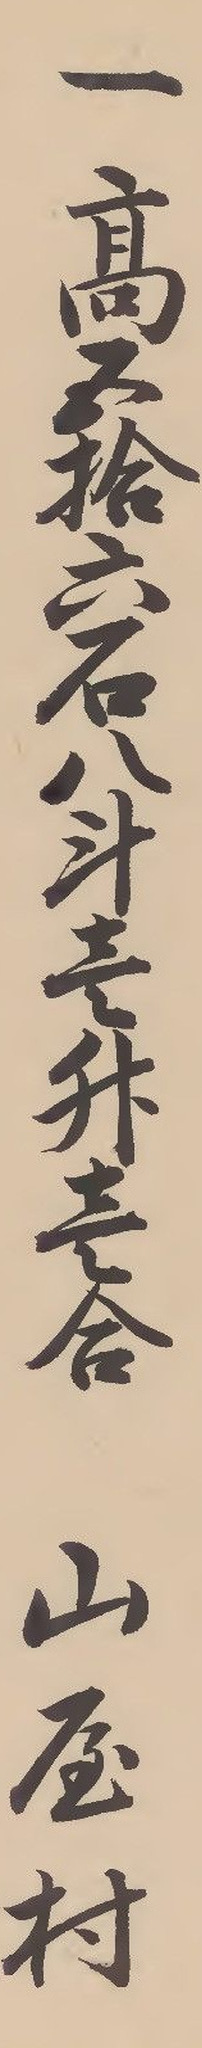一高五拾六石八斗壱升壱合山屋村
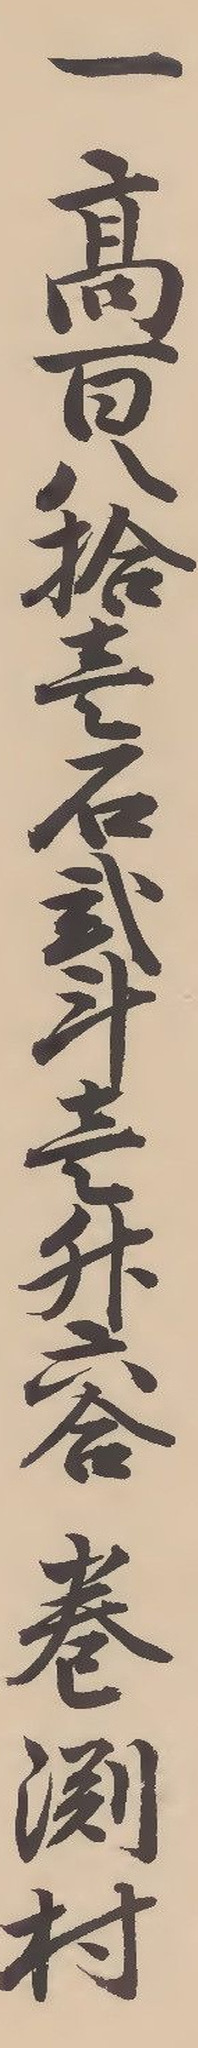一高百八拾壱石弐斗壱升六合巻淵村
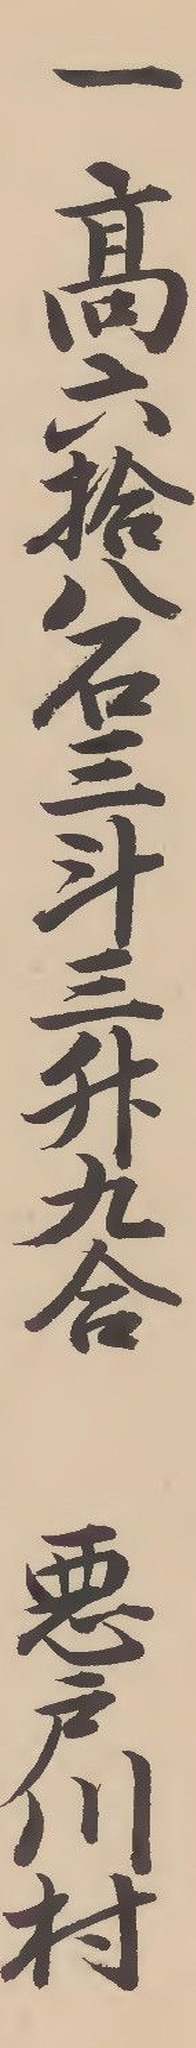一高六拾八石三斗三升九合悪戸川村
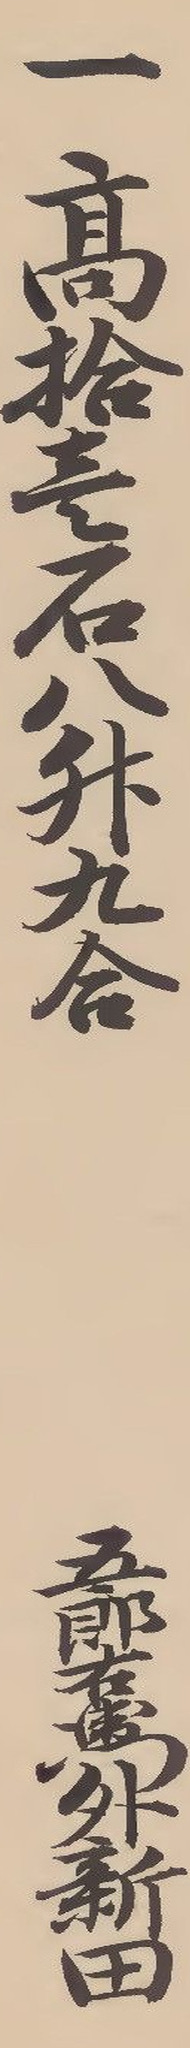一高拾壱石八升九合五郎右衛門外新田
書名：越後国郷帳　中
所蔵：国立公文書館 National Archives of Japan
